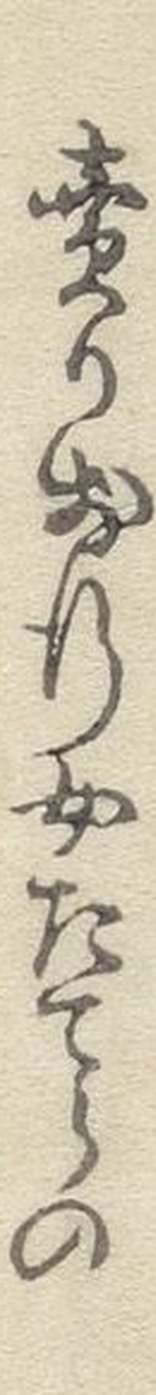売り歩行女たてらの
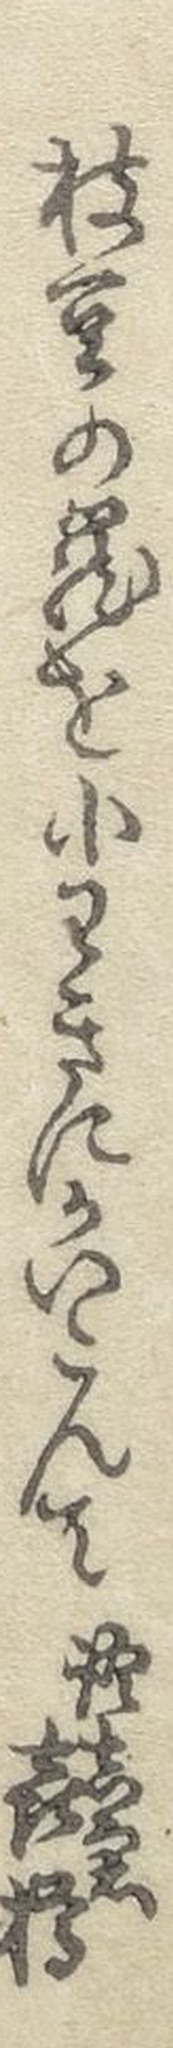枝豆の籠を小わきにかいこんて語古窓
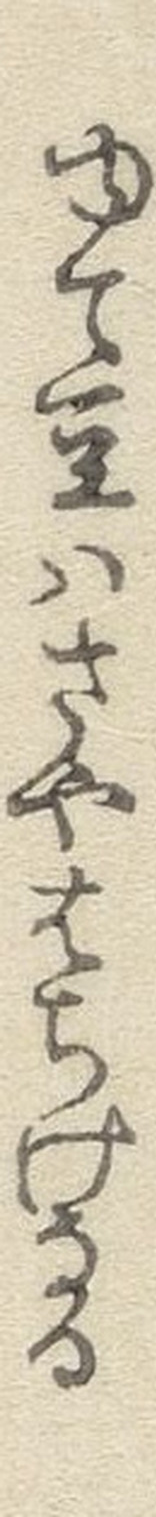ゆて豆はさやはちけなる
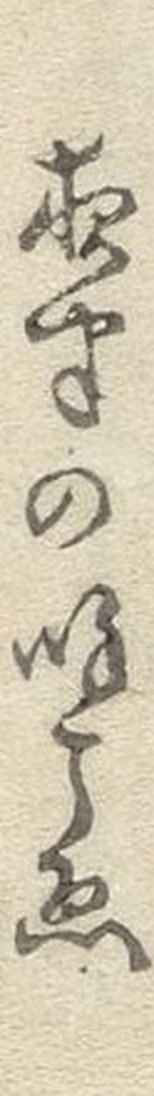夜半の呼こゑ
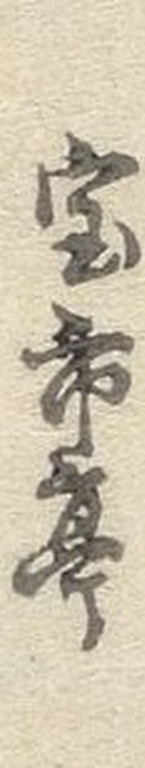宝市亭
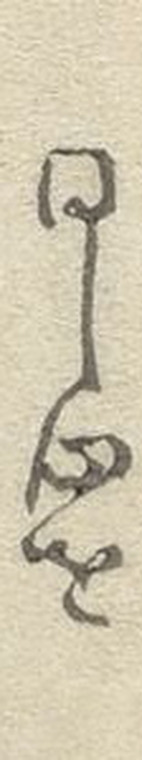同し心を
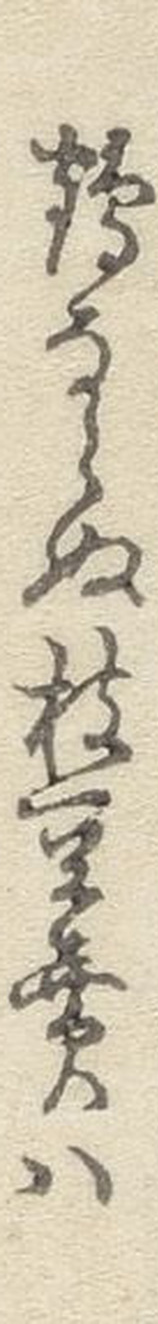鶴ならぬ枝豆売は
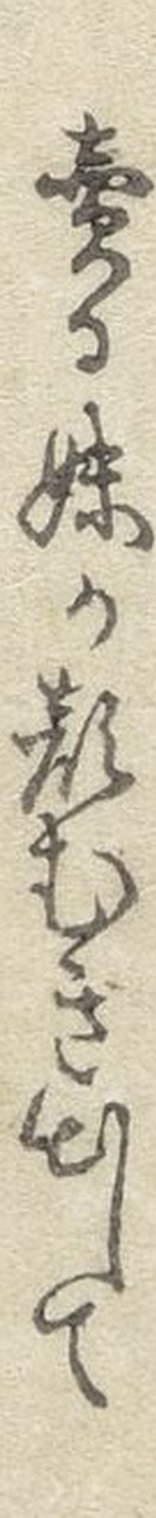売る妹か顔むき出して
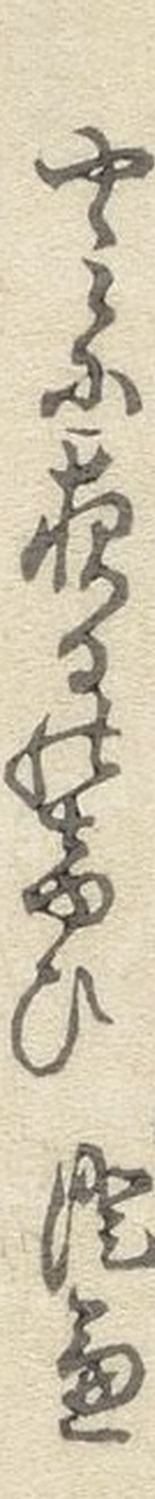やみに夜るの商ひ澄兼
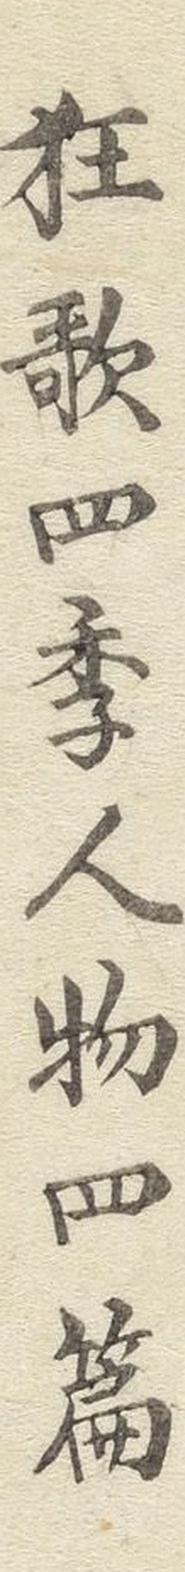狂歌四季人物四篇
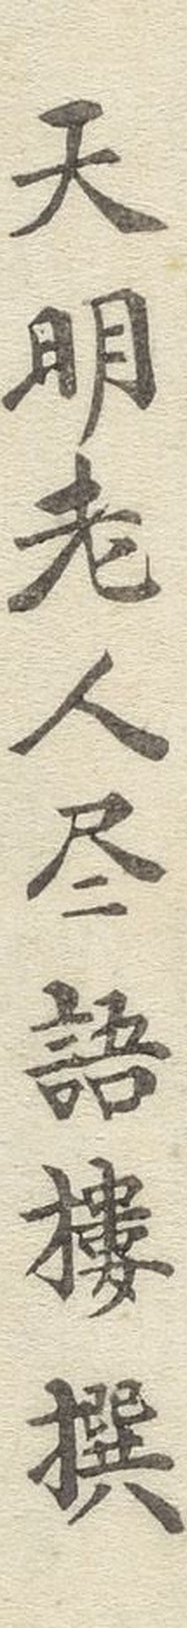天明老人尽語楼撰
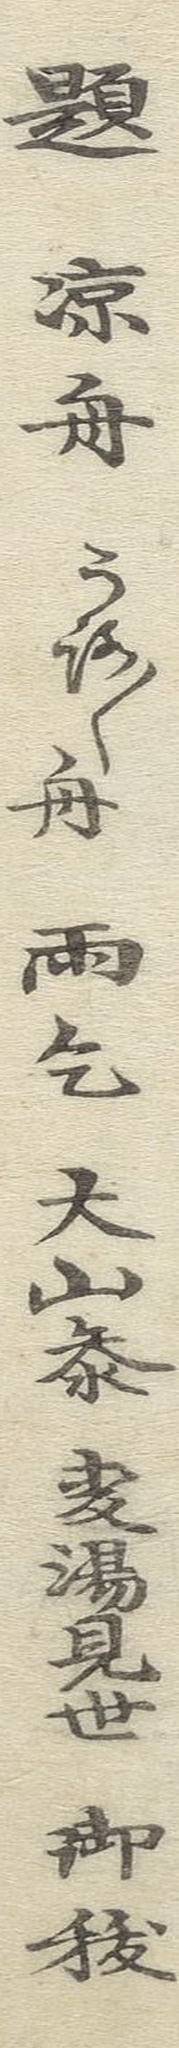題涼舟うろ〳〵舟雨乞大山参麦湯見

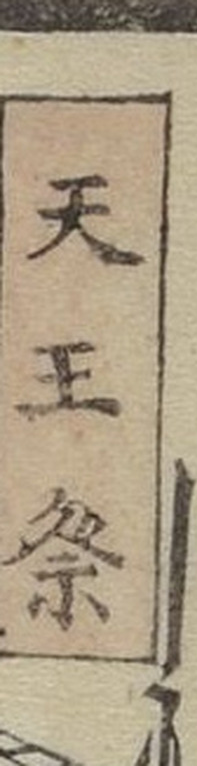天王祭
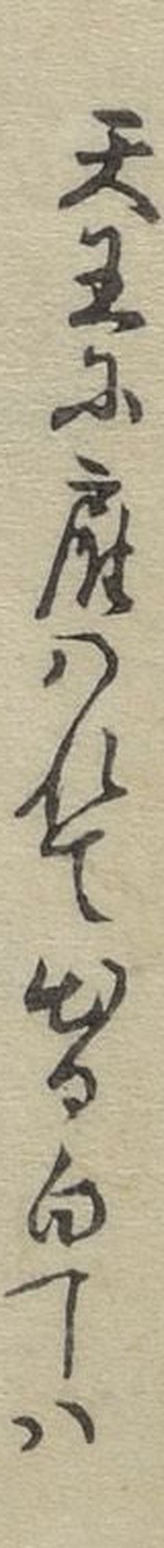天王に雇はれて出る白丁は
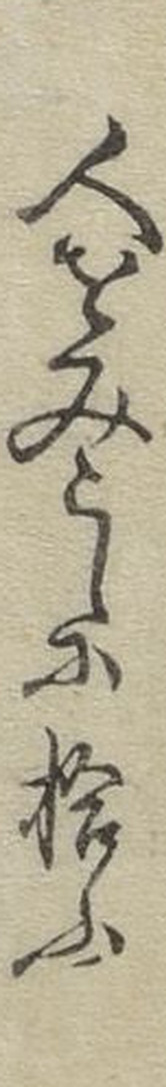人をみこしに拾ふ
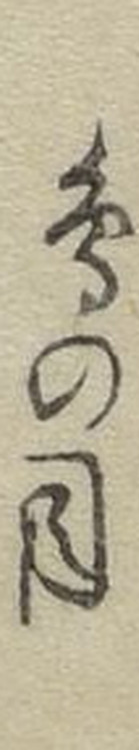鳥の目
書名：Picture Album of People with Kyōka (Light Verse) (Kyōka shiki jinbutsu 狂歌四季人物)
